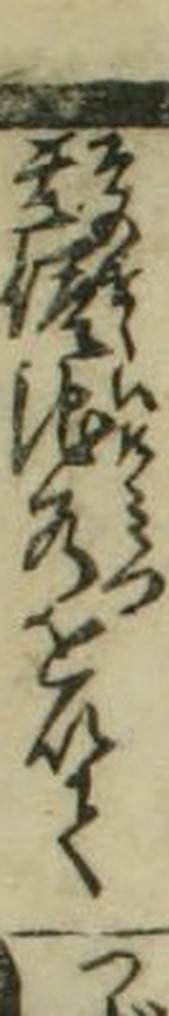其侭池水を以て
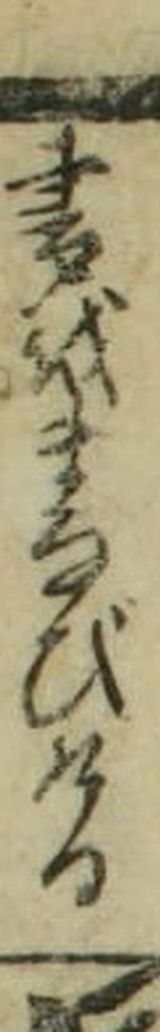書をまなびける

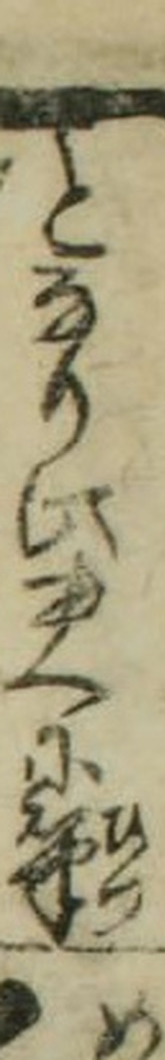となり此ゆへに筆
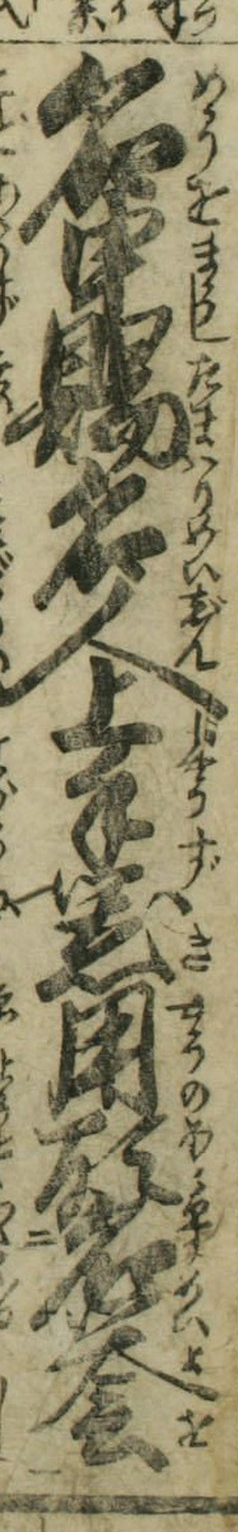名申賜名人上手器用顕名誉
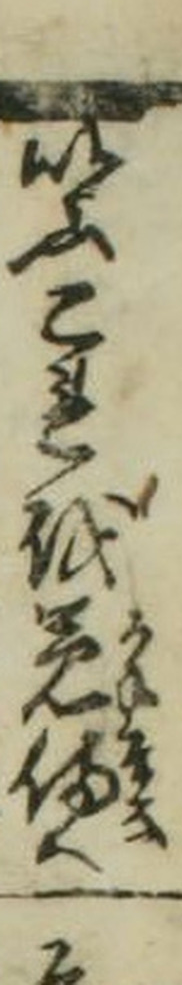いふこれを兼備へ
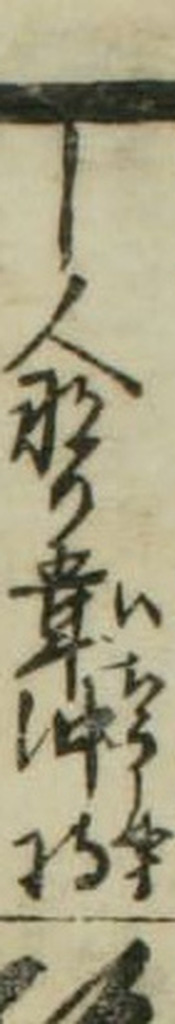し人なり韋沖将
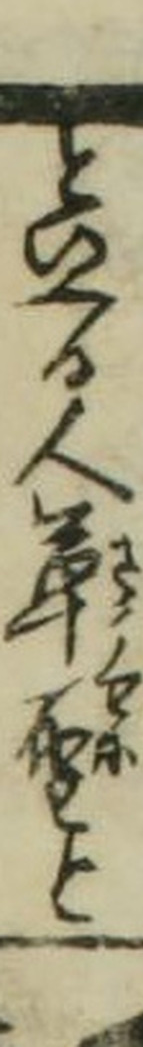といへる人草聖と
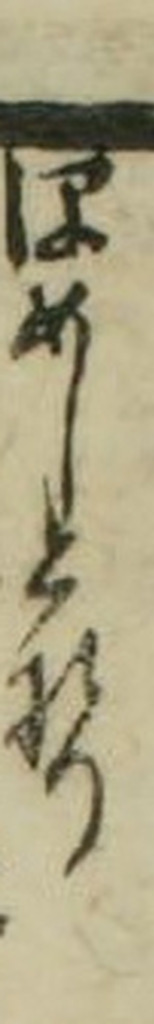ほめしとなり
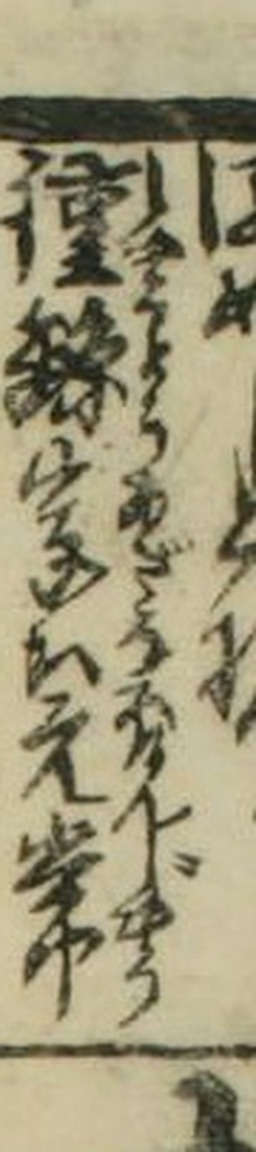鍾繇字は元常
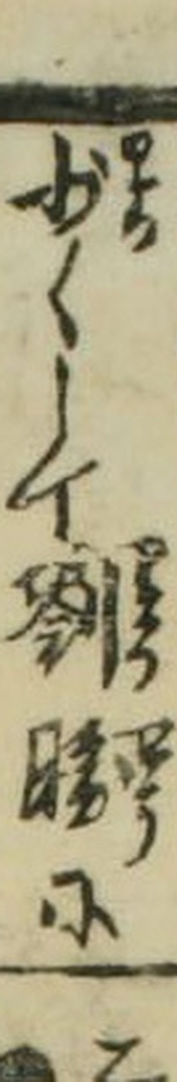少くして劉勝に
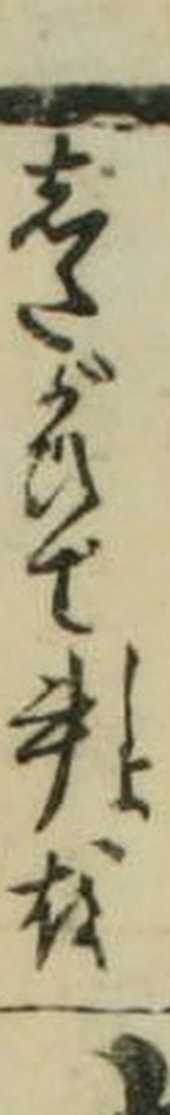したがひて書を
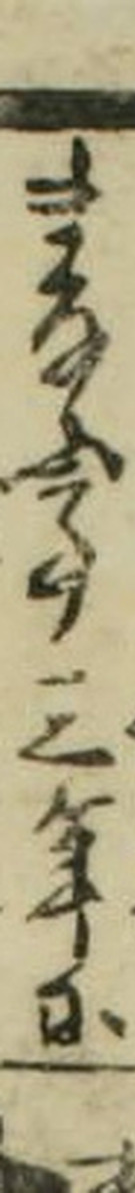まなふ事三年に
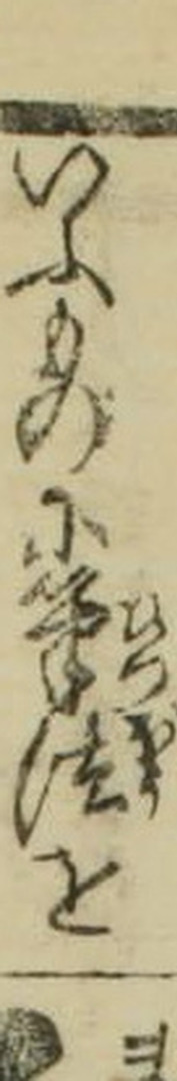いふものに筆法を
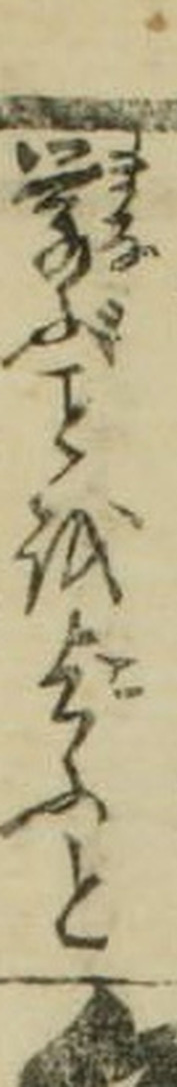学ぶことを乞ふと
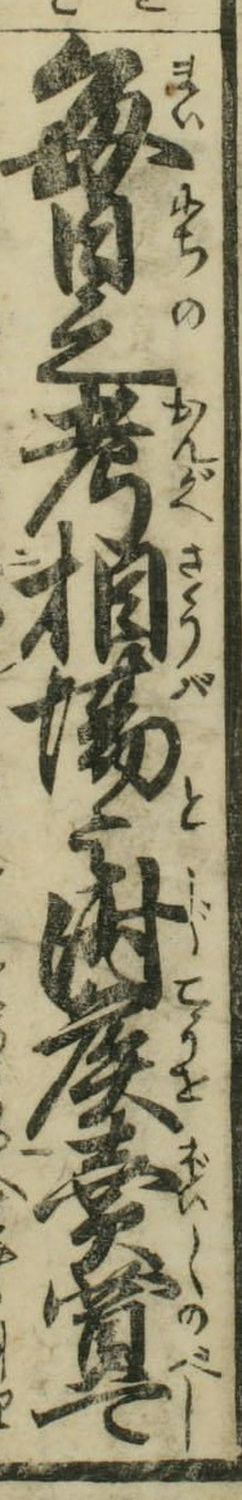毎日之考相場与時矦賣買可
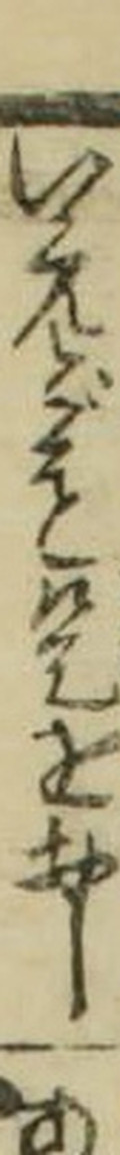いへども是をおし
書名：増補職人往来
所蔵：東京学芸大学教育コンテンツアーカイブ
